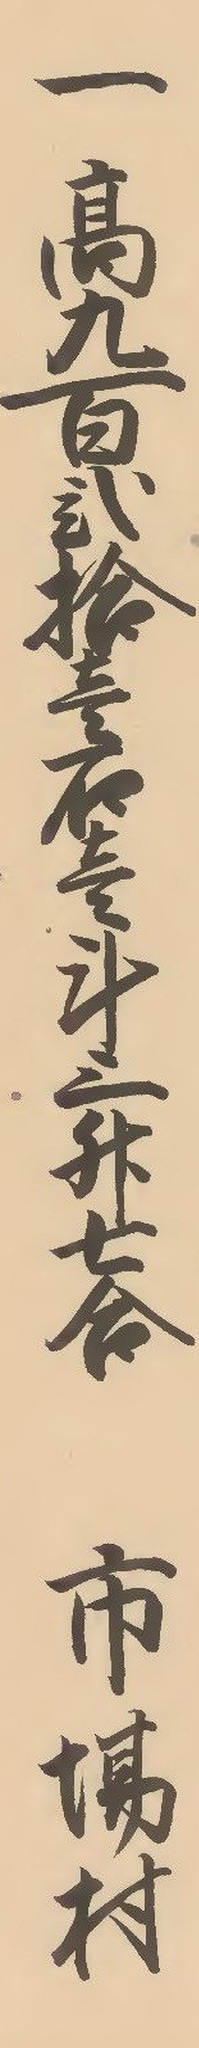一高九百弐拾壱石壱斗三升七合市場村

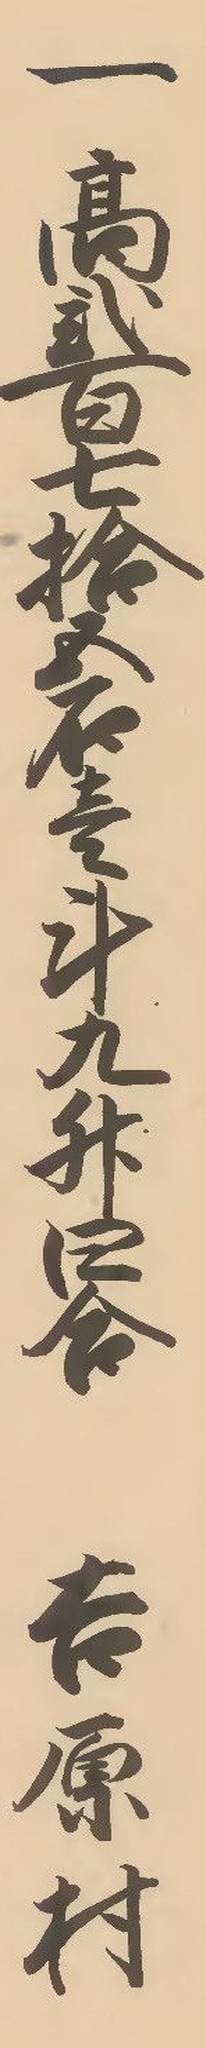一高弐百七拾五石壱斗九升四合吉原村
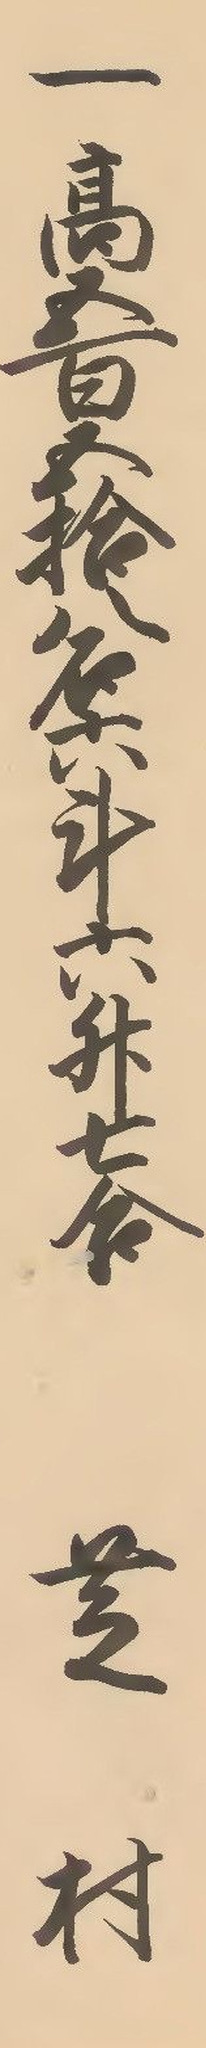一高五百五拾八石六斗六升七合芝村
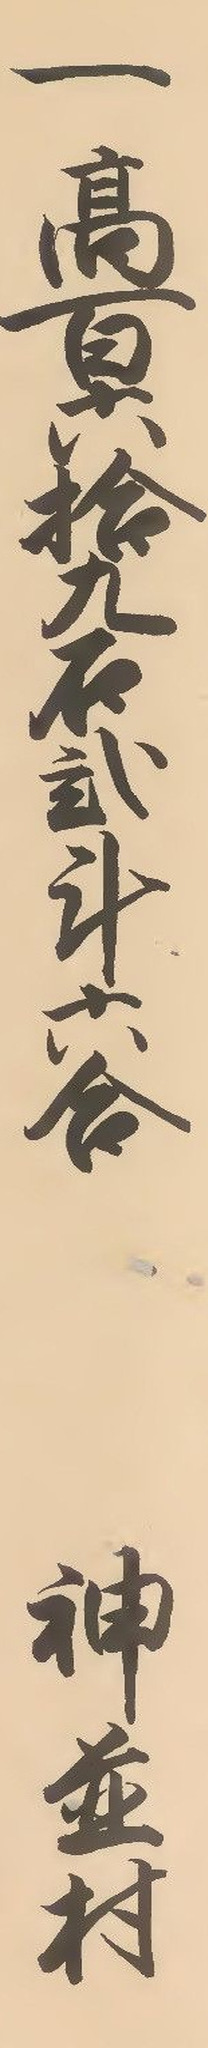一高百六拾九石弐斗六合神並村
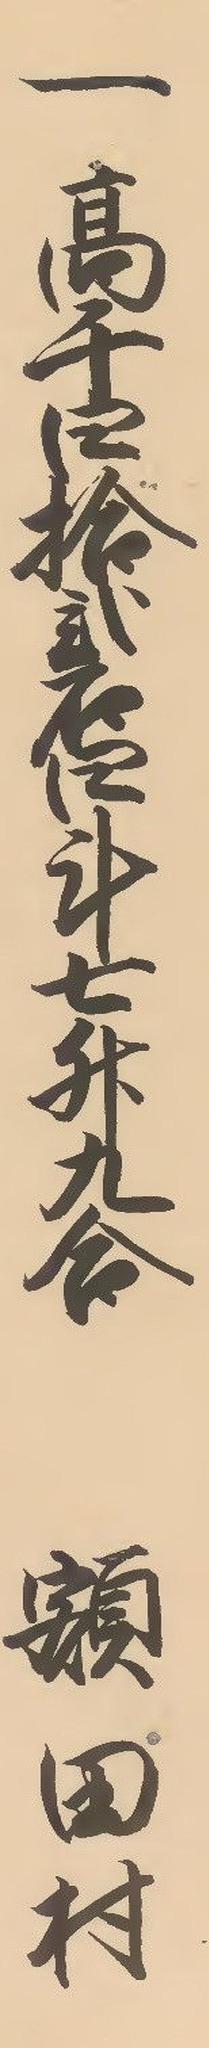一高千四拾弐石四斗七升九合額田村
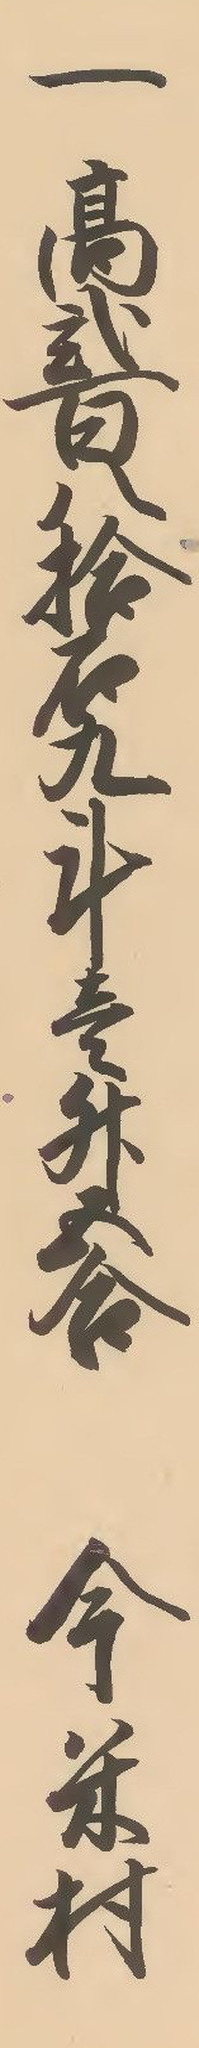一高弐百八拾石九斗壱升五合今米村

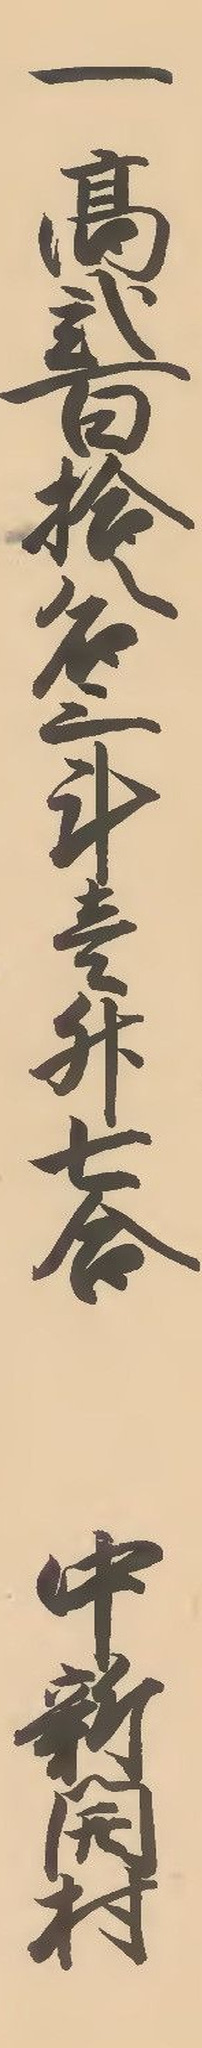一高弐百拾八石三斗壱升七合中新開村
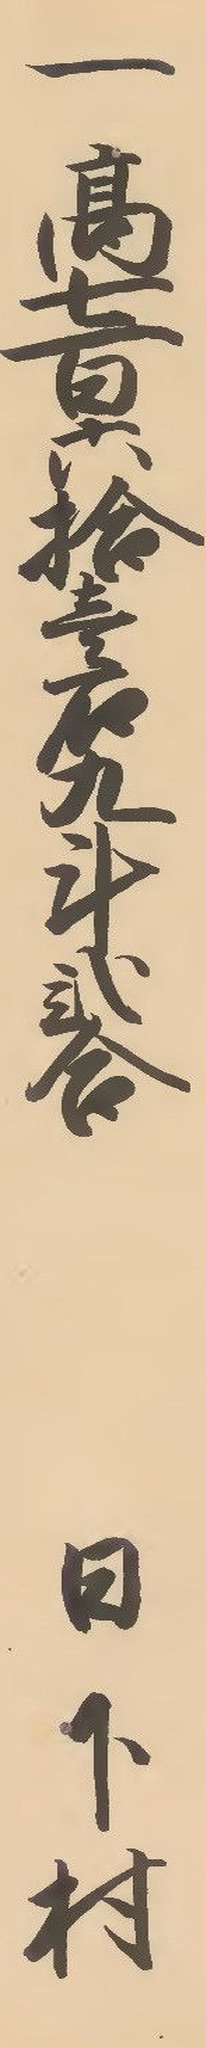一高七百六拾壱石九斗弐合日下村
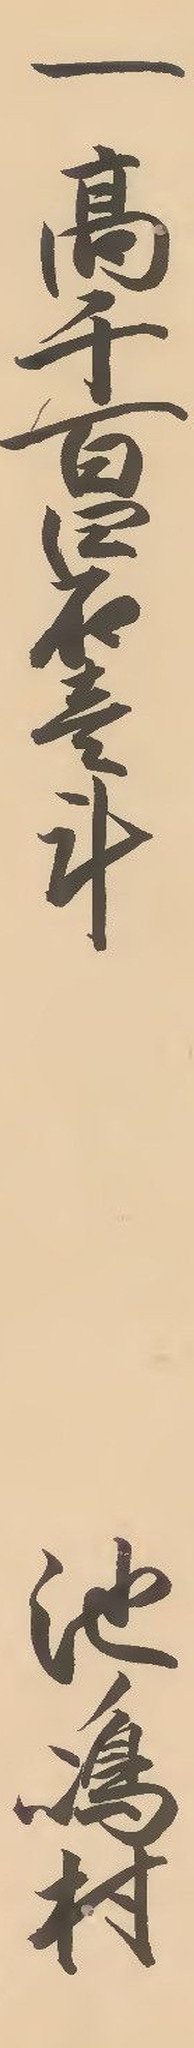一高千百四石壱斗池ノ島村
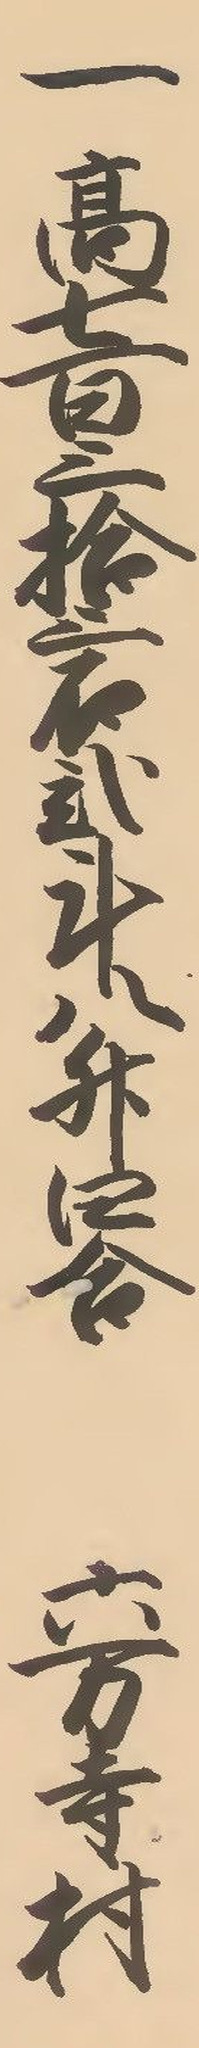一高七百三拾三石弐斗八升四合六万寺村
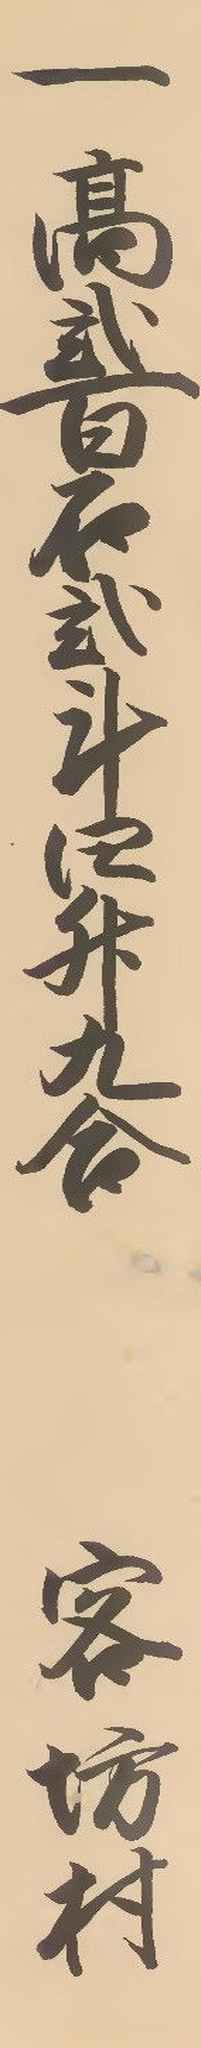一高弐百石弐斗四升九合客坊村
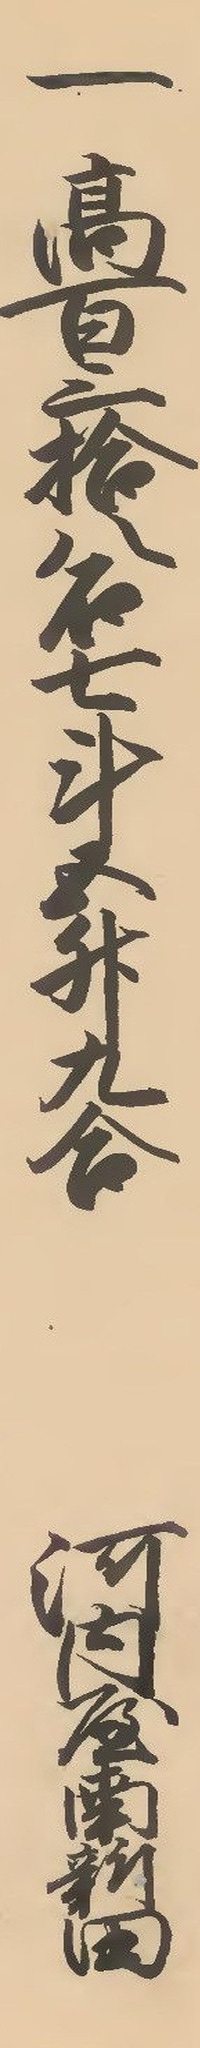一高百三拾八石七斗五升九合河内屋南新田
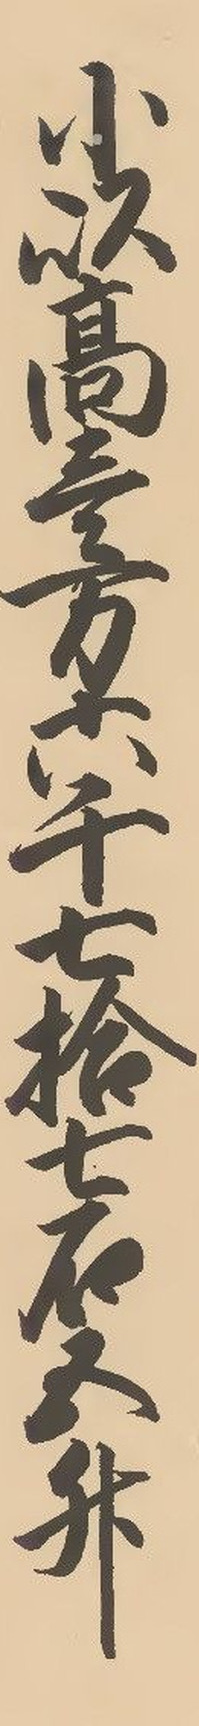小以高壱万六千七拾七石五升

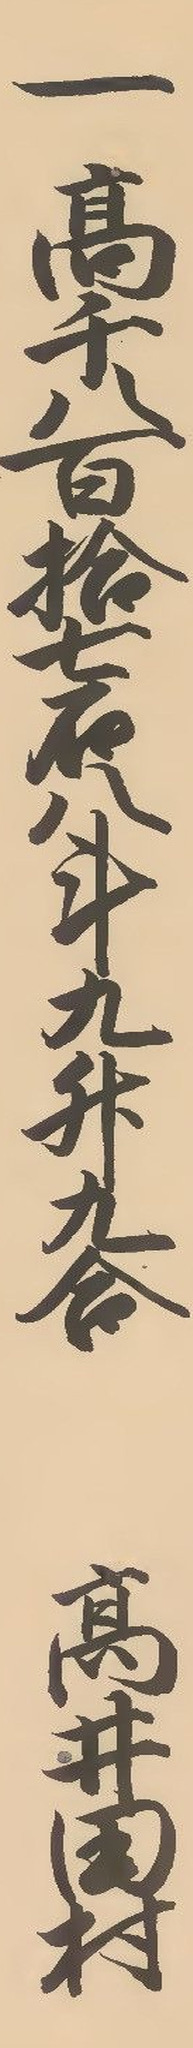一高千八百拾七石八斗九升九合高井田村
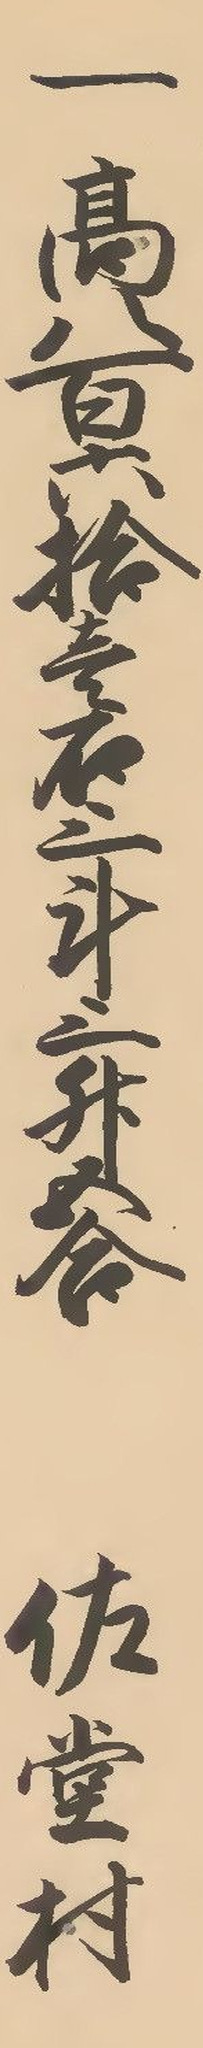一高八百六拾壱石三斗三升五合佐堂村
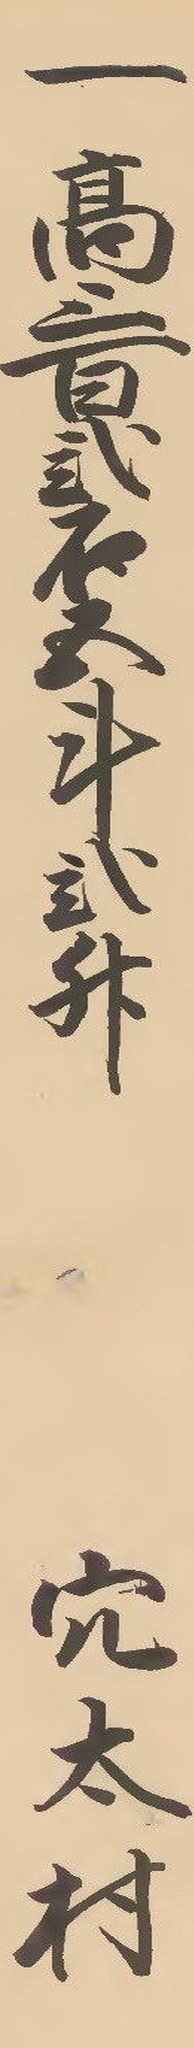一高三百弐石五斗弐升穴太村
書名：河内国郷帳
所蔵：国立公文書館 National Archives of Japan
